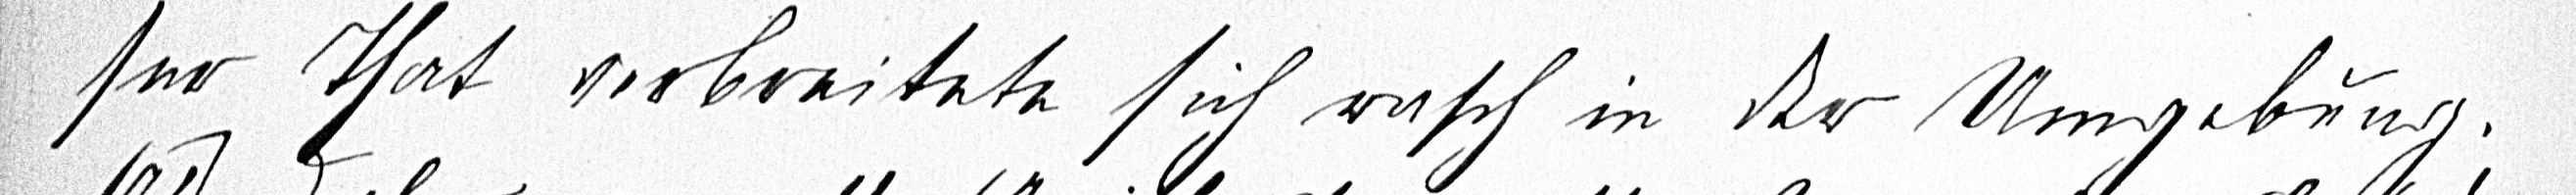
ser That verbreitete sich rasch in der Umgebung.
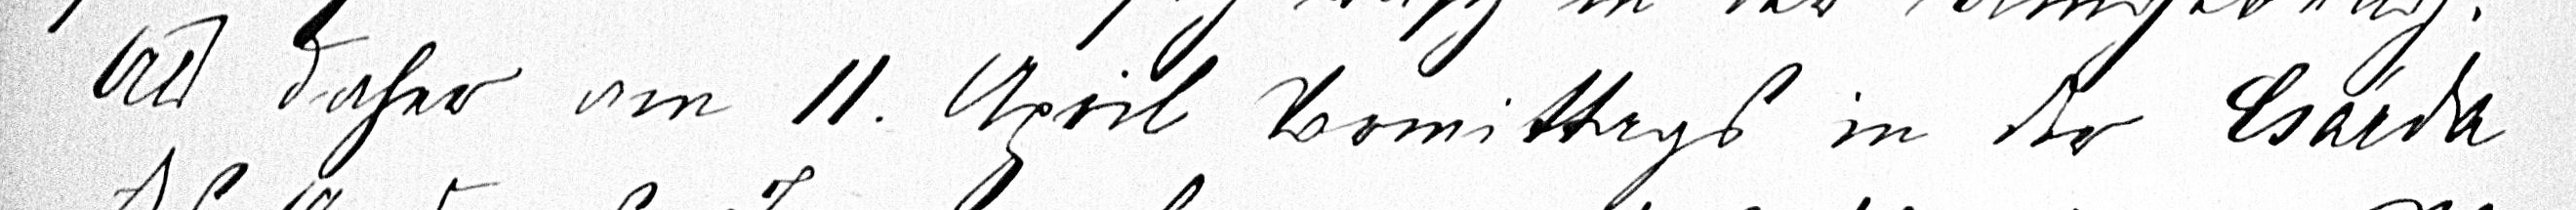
Als daher am 11. April Vormittags in der Csárda
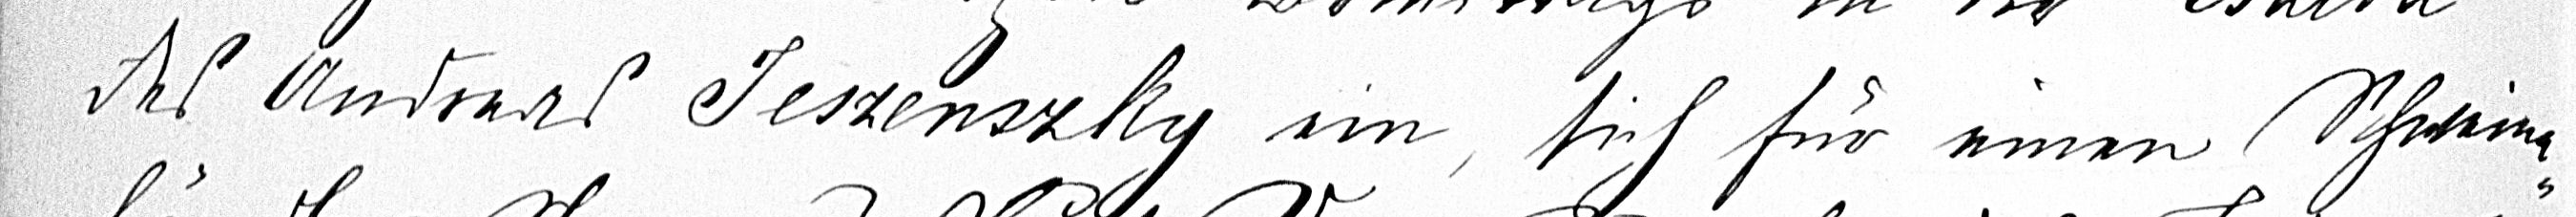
des Andreas Jeszenszky ein, sich für einen Schweine¬
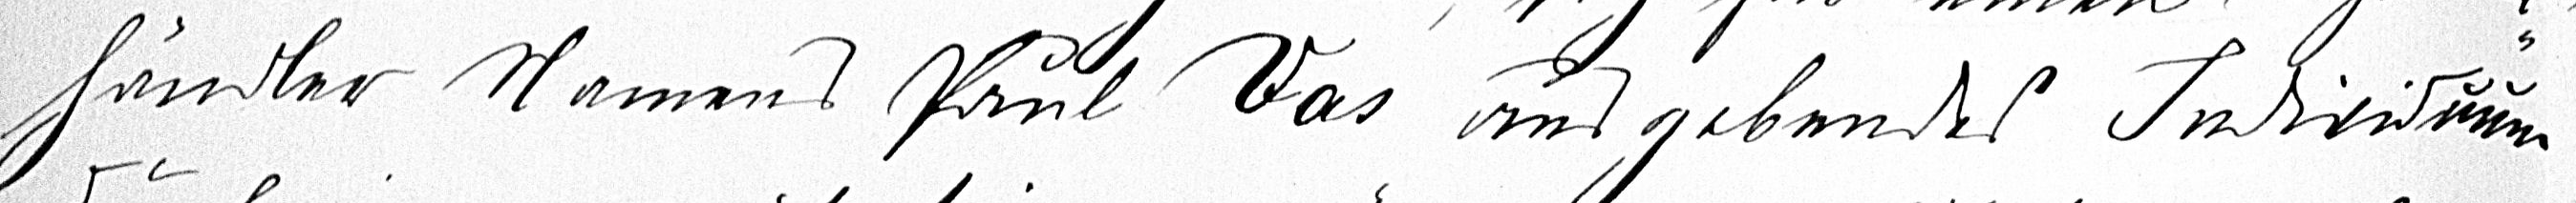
händler Namens Paul Vas ausgebendes Individuum
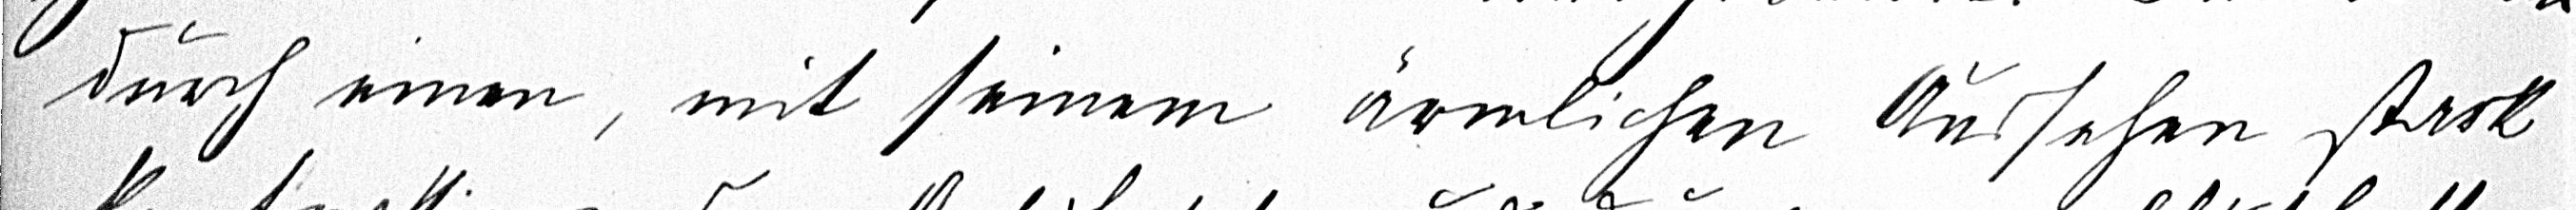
durch einen, mit seinem ärmlichen Aussehen stark
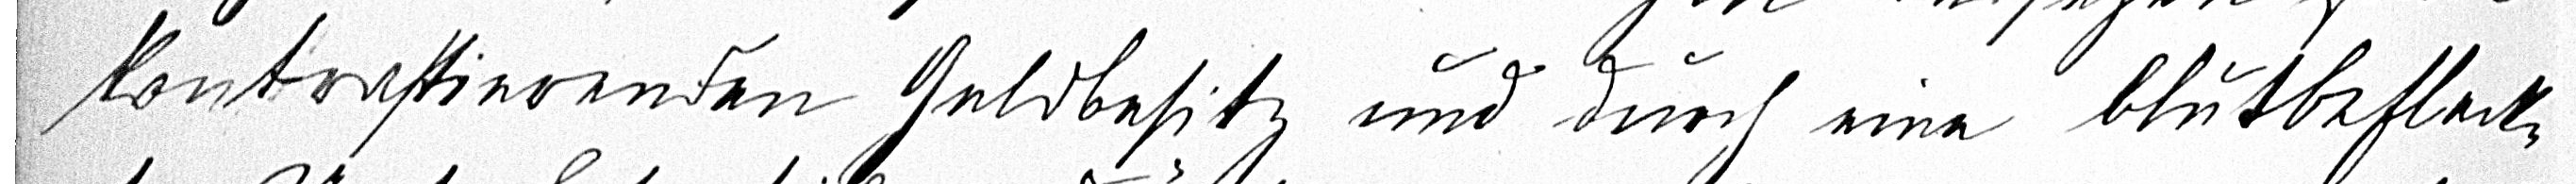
kontrastierenden Geldbesitz und durch eine blutbefleck¬
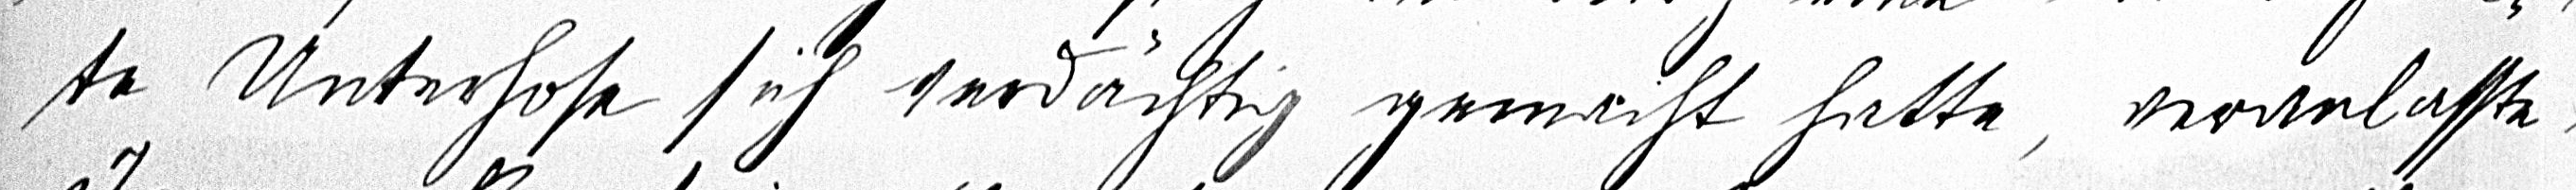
te Unterhofse sich verdächtig gemacht hatte, veranlasste
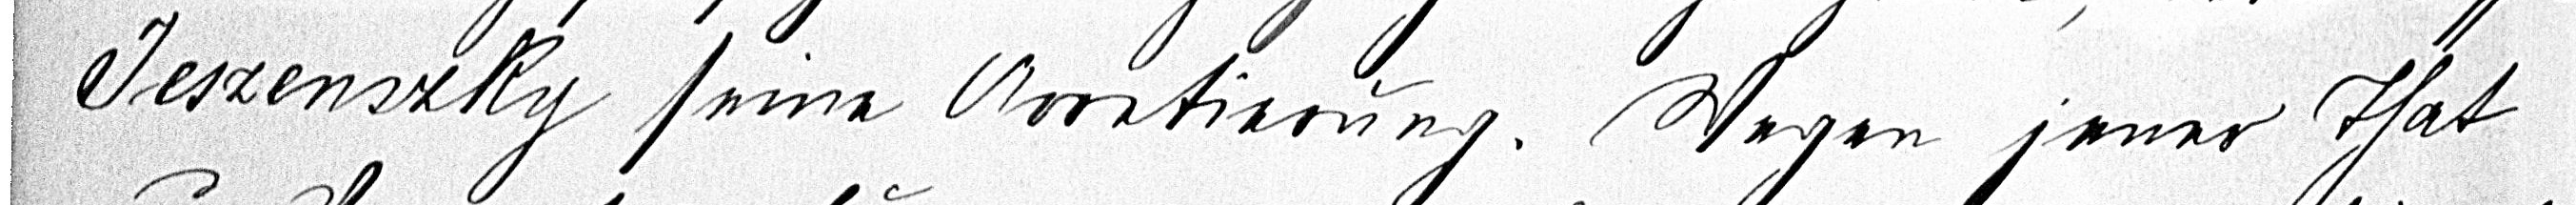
Jeszenszky seine Arretierung. Wegen jener That
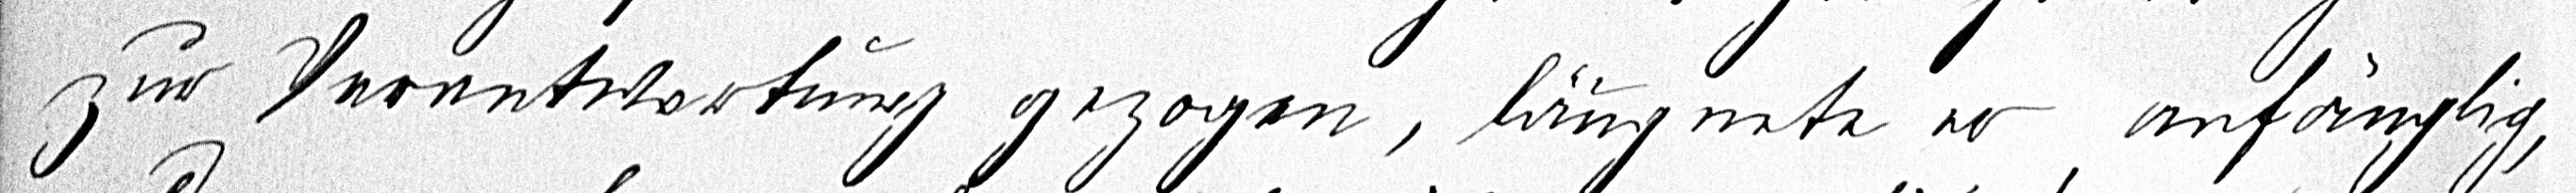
zur Verantwortung gezogen, läugnete er anfänglig,
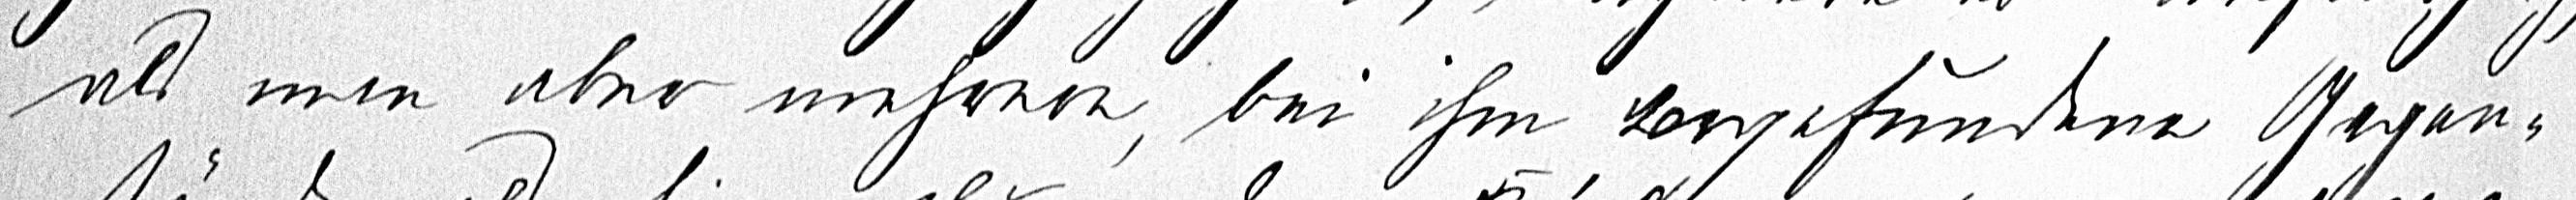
als man aber mehrere, bei ihm vorgefundene Gegen¬
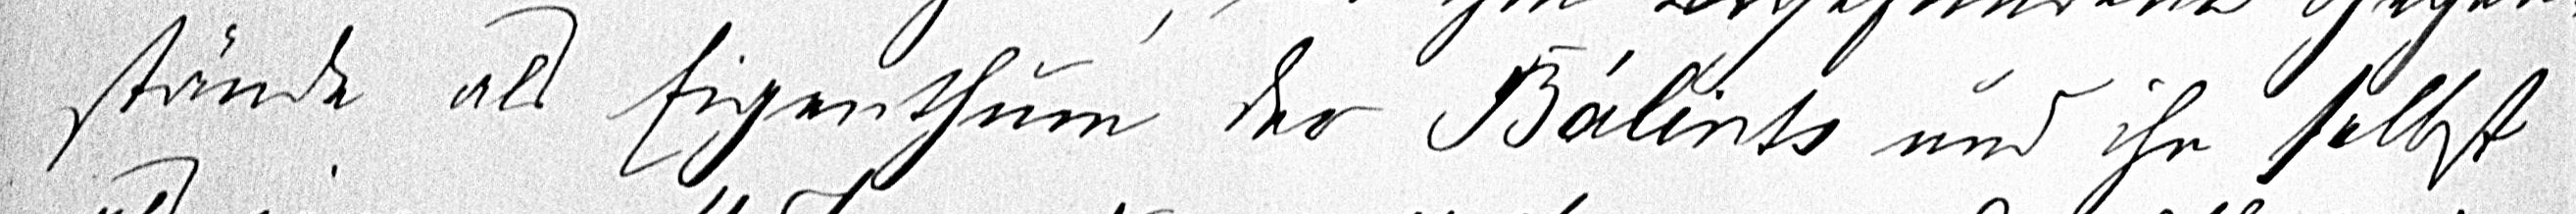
stände als Eigenthum der Bálints und ihn selbst
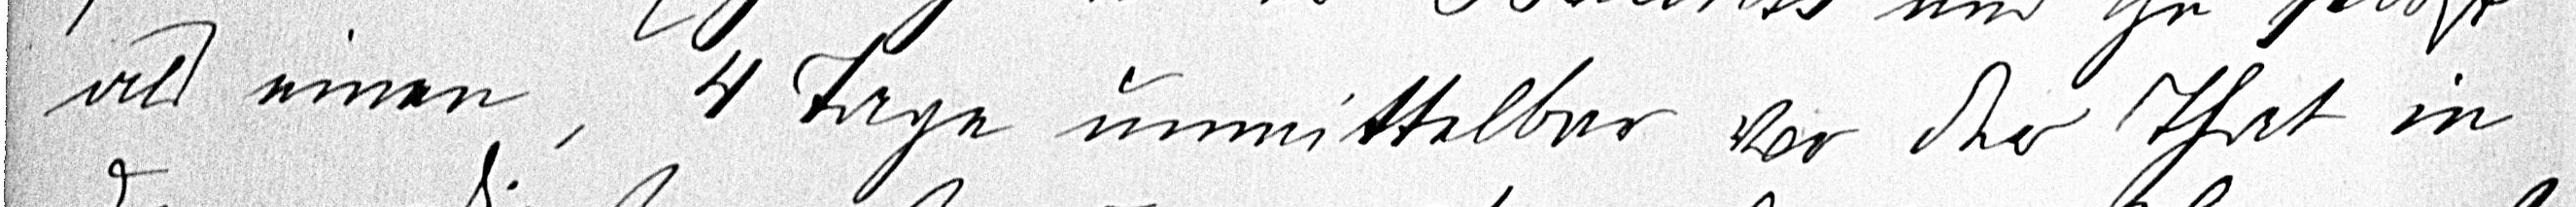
als einen, 4 Tage unmittelbar vor der That in
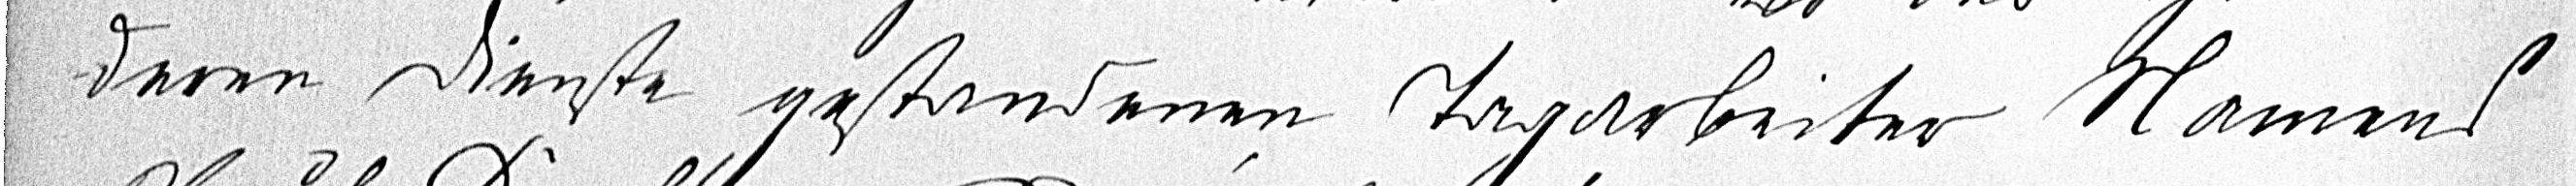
deren Dienste gestandenen Tagarbeiter Namens
